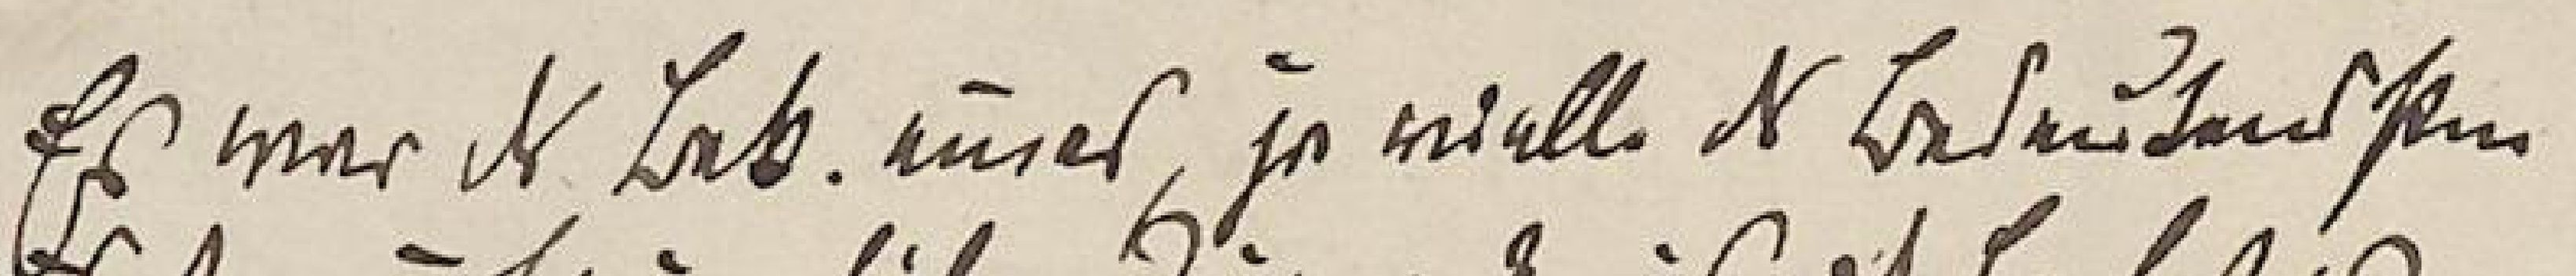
Es war ds Bek. eines, ja viell. des Bedeutendsten
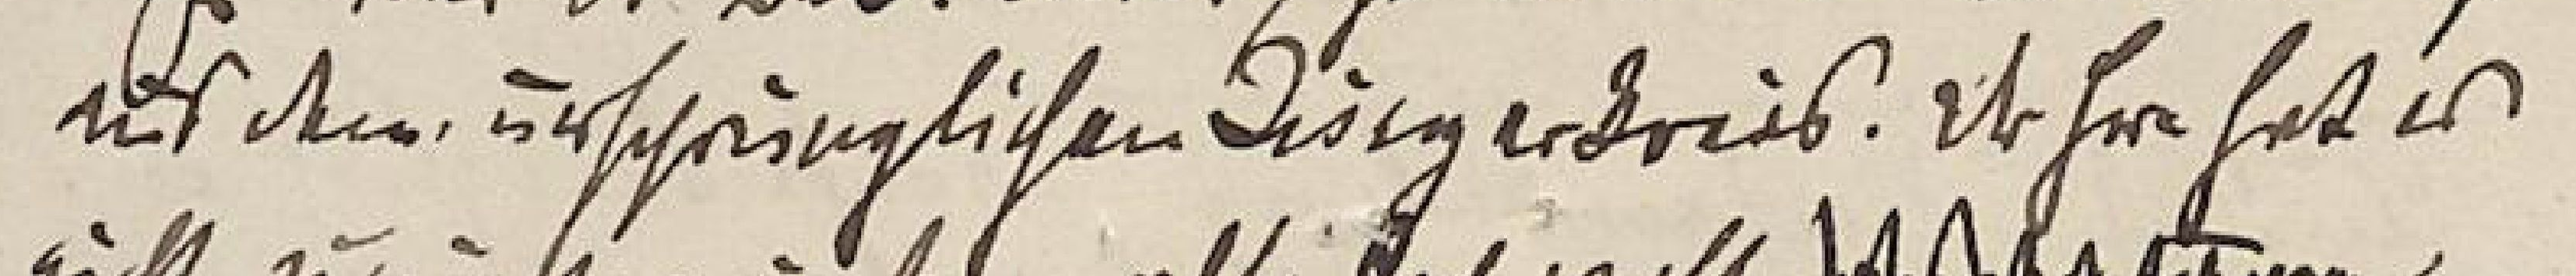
aus dem ursprünglichen Jüngerkreis. Dr Hr hat es
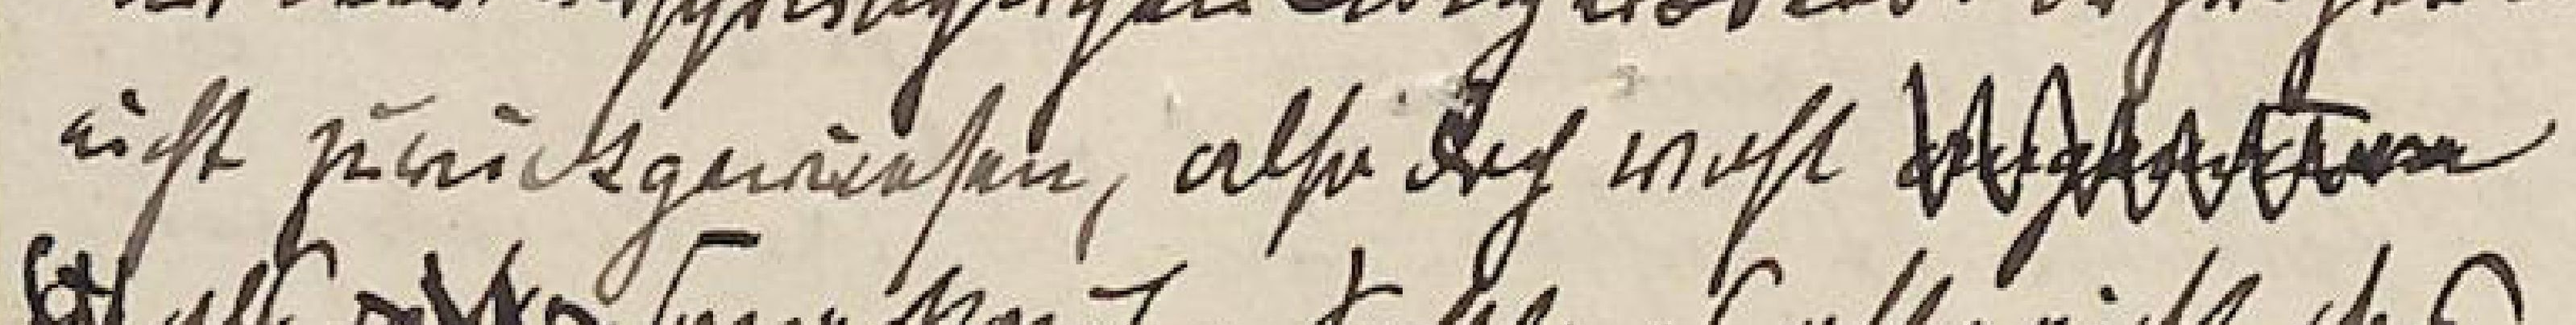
nicht zurückgewiesen, als doch wohl angenomen
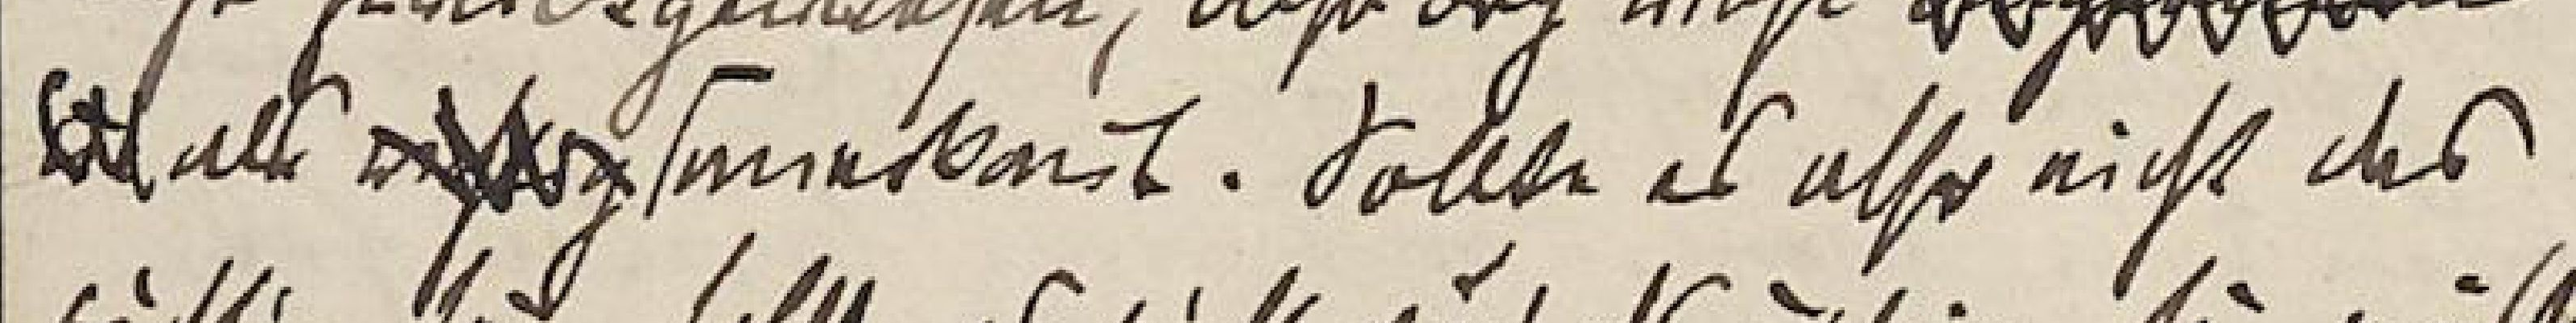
u. als richtig anerkant. Sollte es also nicht das
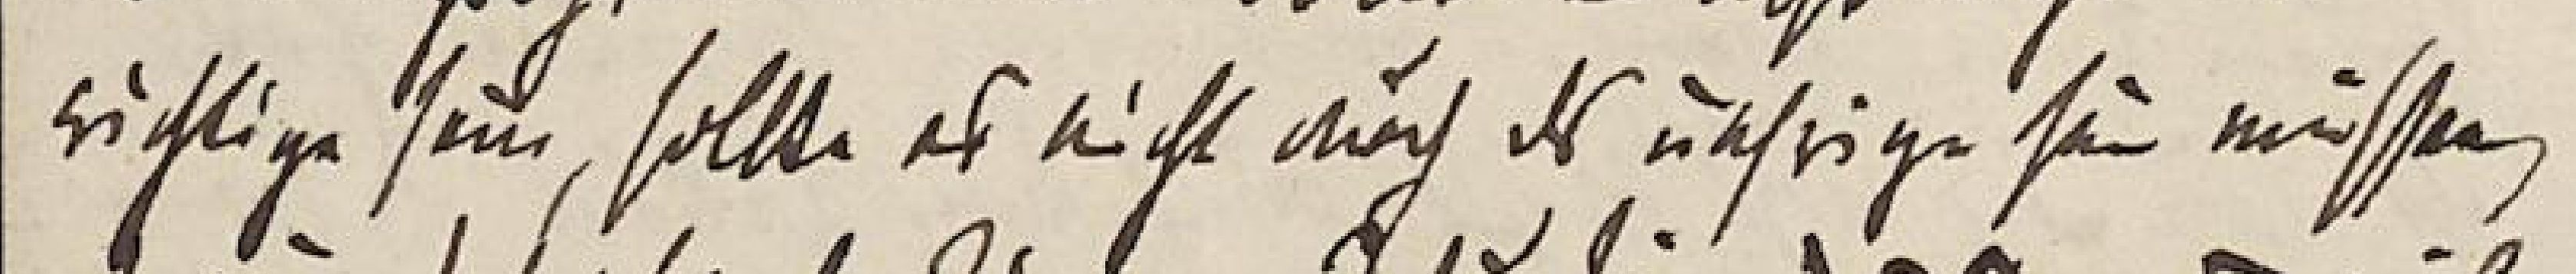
richtige sein, sollte es nicht auch ds unsrige sein müssen,
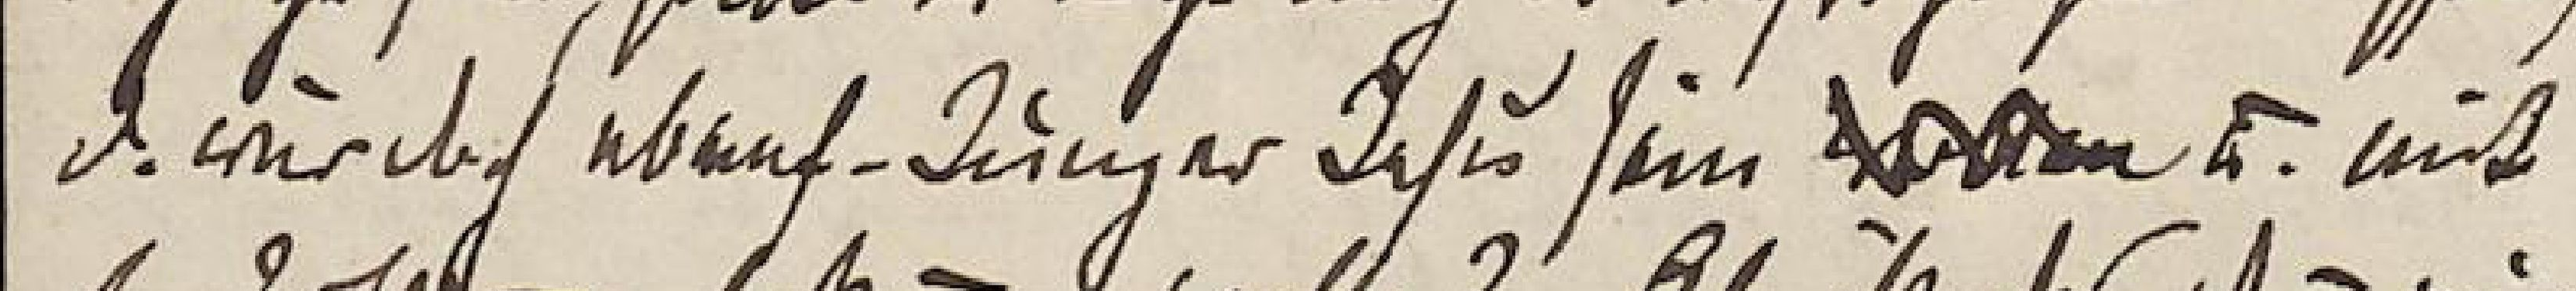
d. wir doch ebens. Jünger Jesu sein wollen u. mit
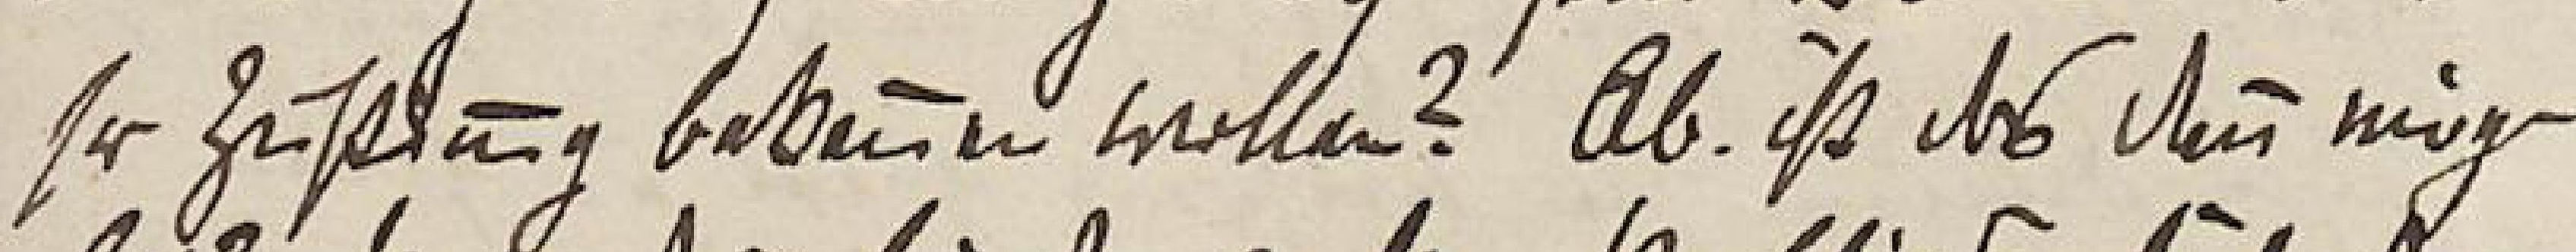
sr Zustimg bekenen wollen? Ab. ist das den mög¬
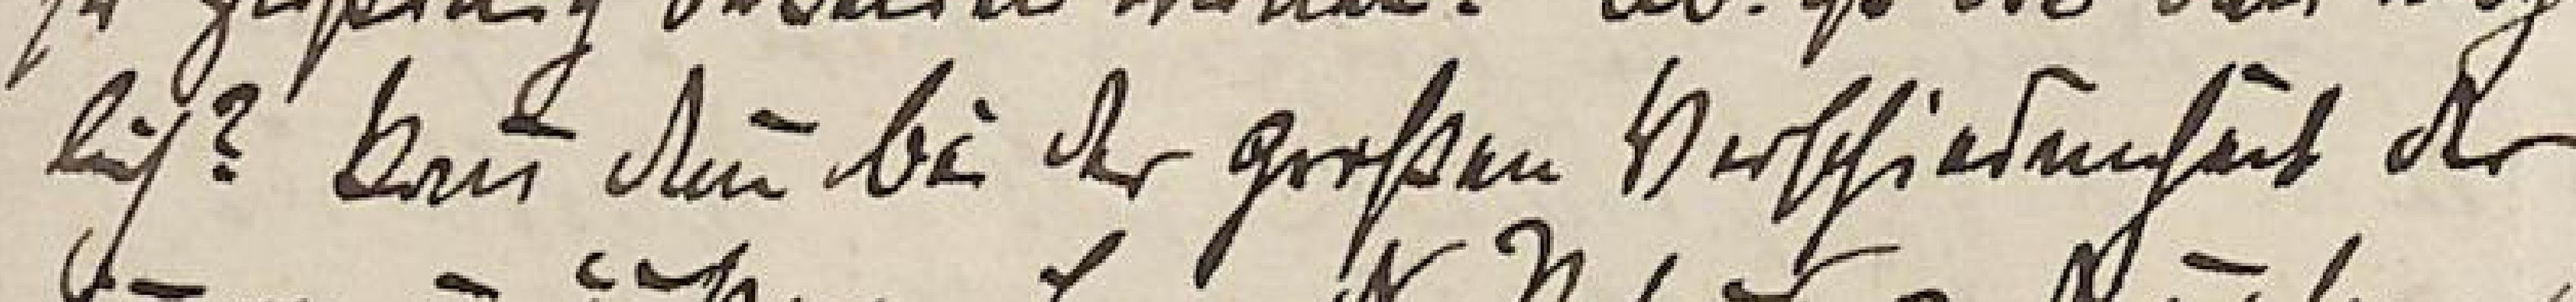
lich? Kan den bei der großen Verschiedenheit der
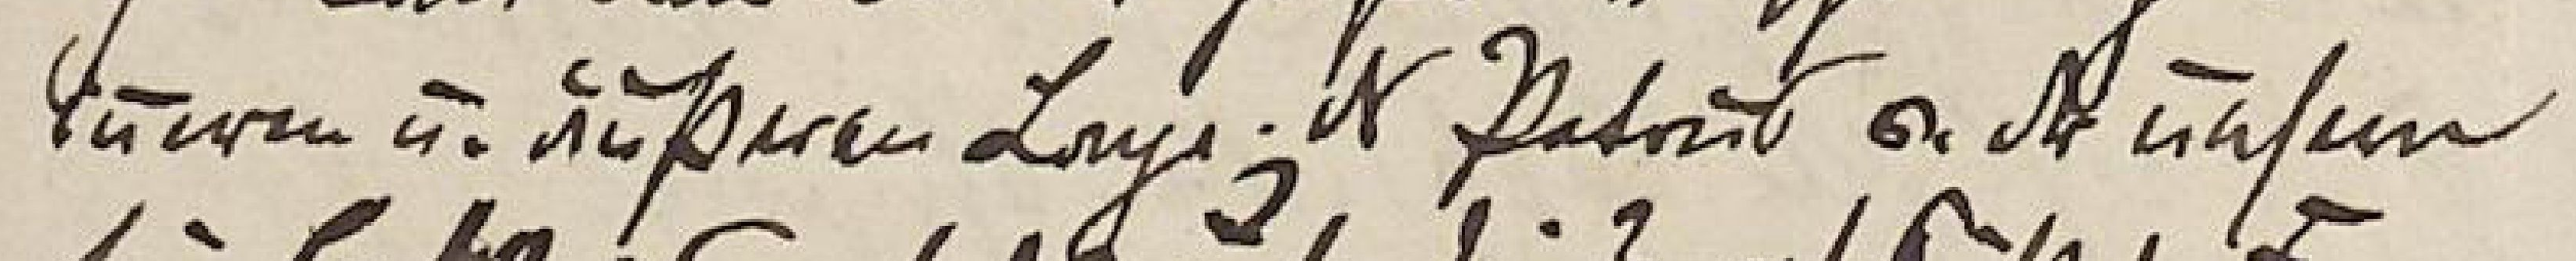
ineren und äußeren Lage ds Petrus v. dr. unsern
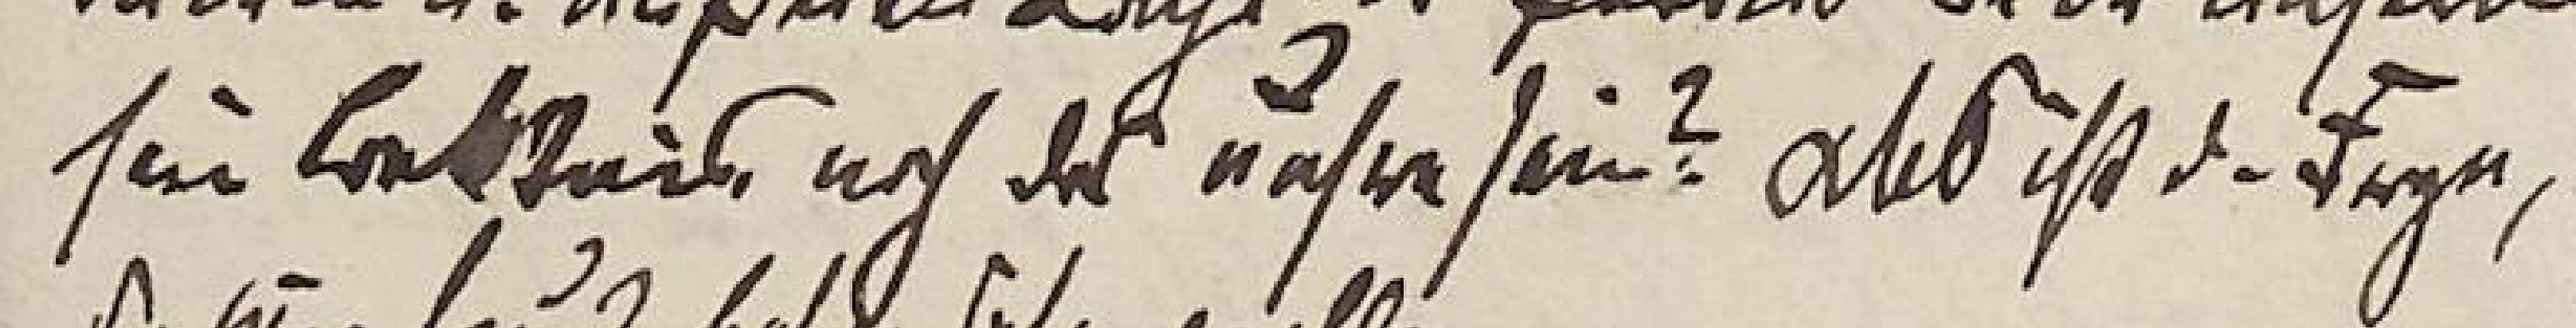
sein Bektnis noch das unsre sein? Das ist d. Frage,
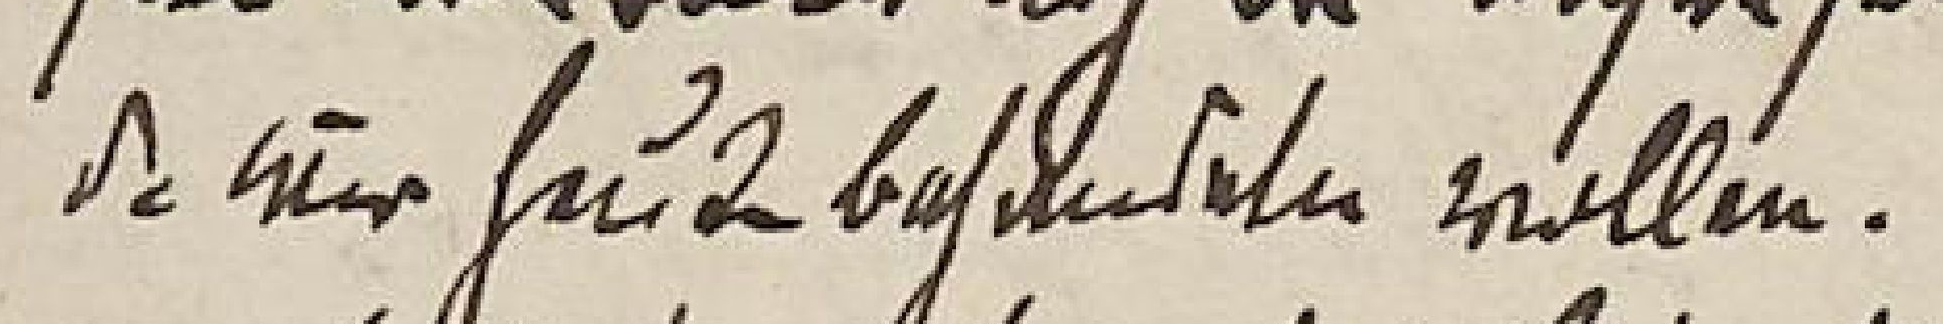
d. wir heute behandeln wollen.
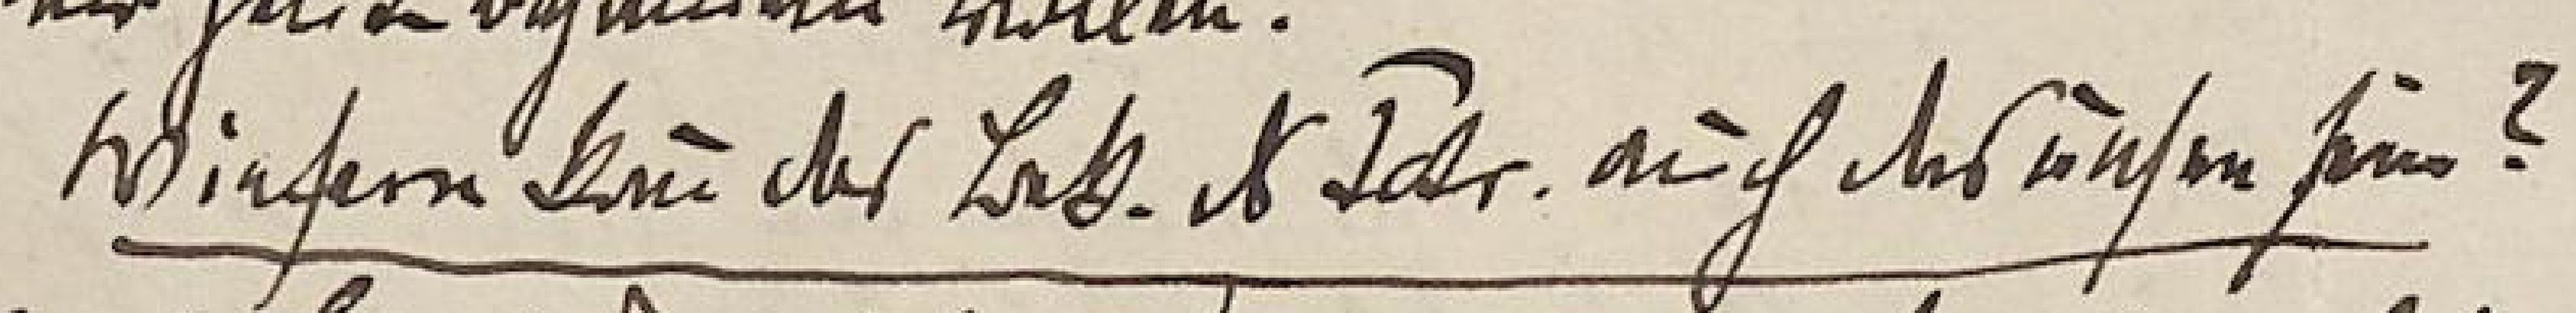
Wiefern kan das Bek. ds. Petr. auch das unsre sein?
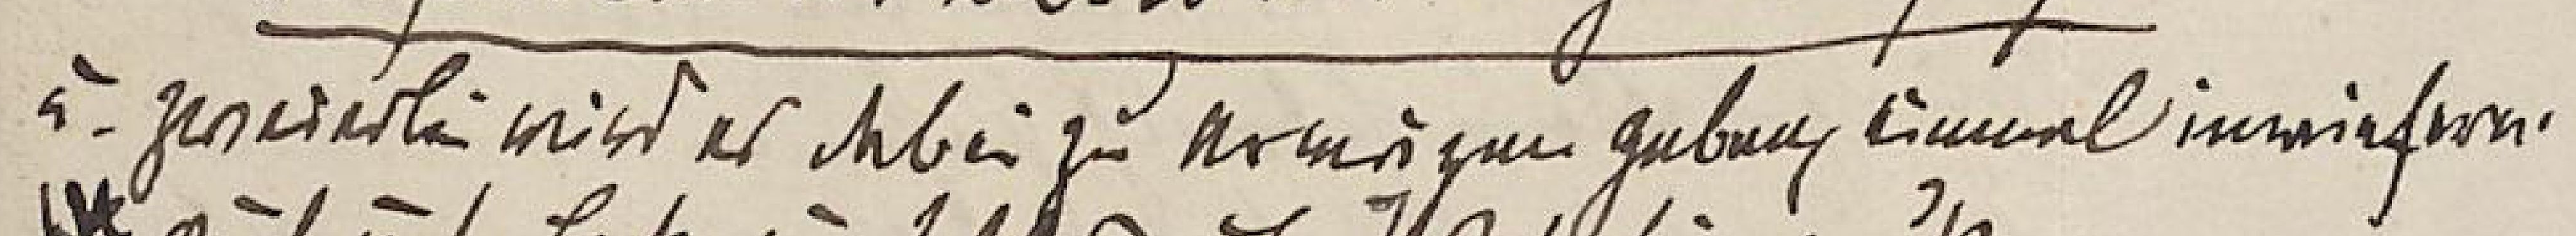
u. zweierlei wird es dabei zu erwägen geben, einmal inwiefern.
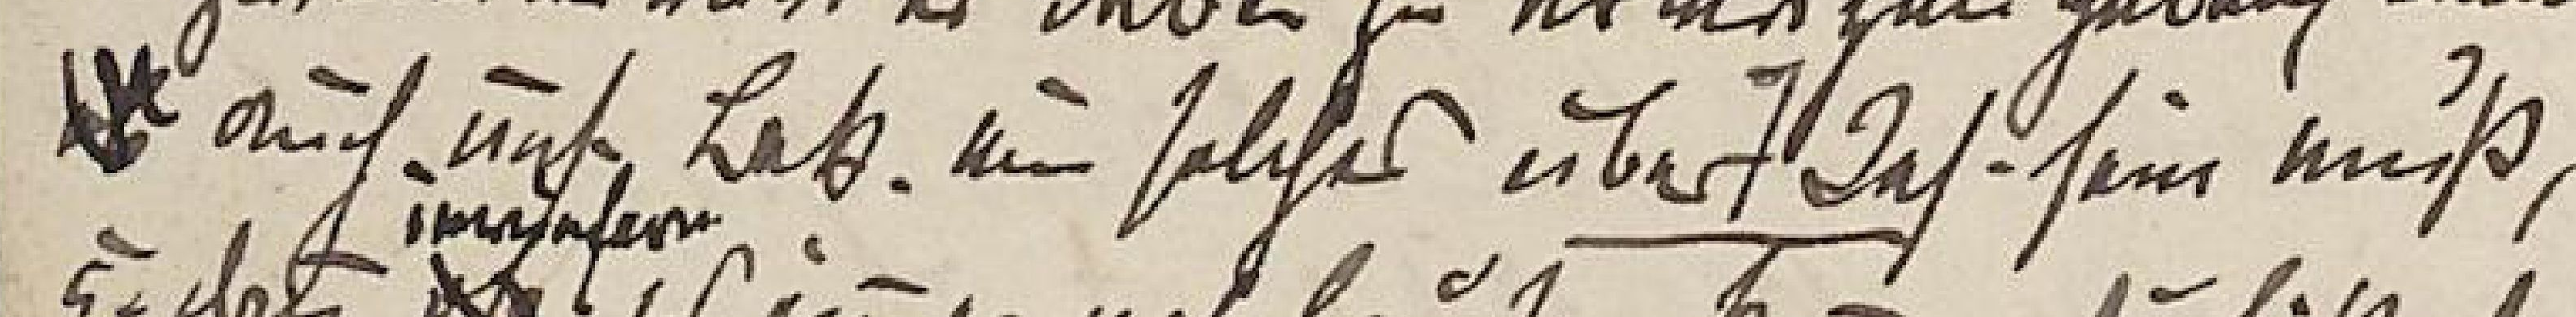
es auch uns. Bek. ein solches über ] Jes. sein muß,
